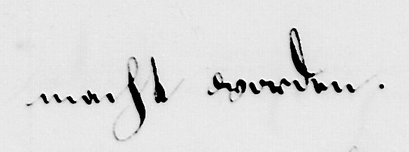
macht worden.
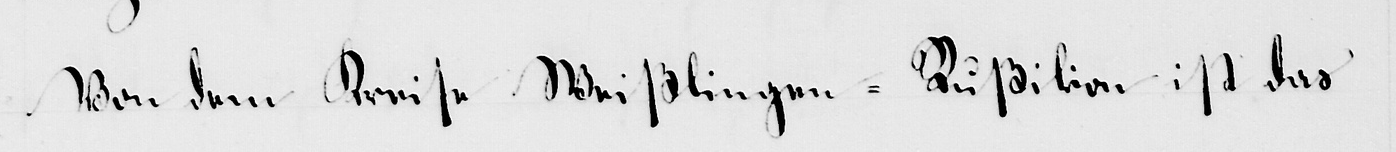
Von dem Kreise Weißlingen-Rußikon ist das
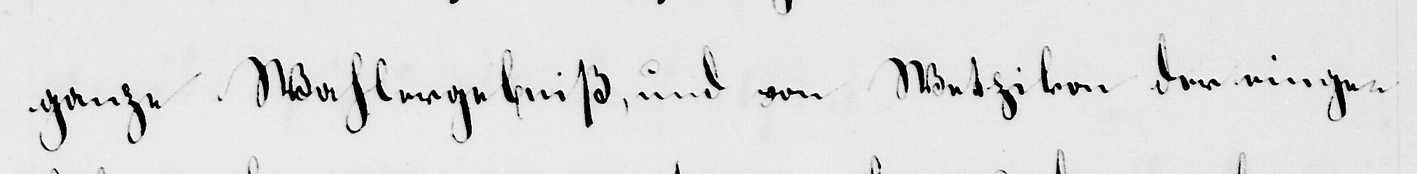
ganze Wahlergebniß, und von Wetzikon der einge¬
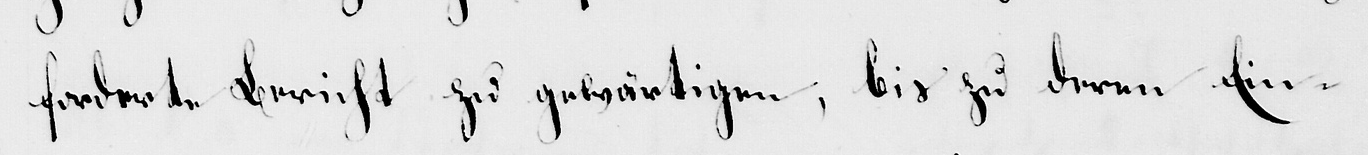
forderte Bericht zu gewärtigen, bis zu deren Ein¬
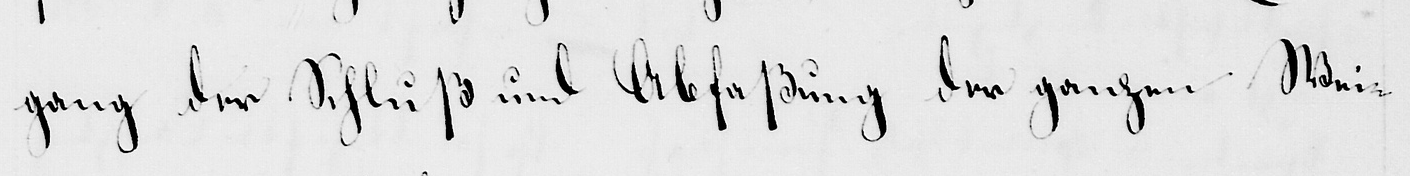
gang der Schluß und Abfaßung der ganzen Wei¬
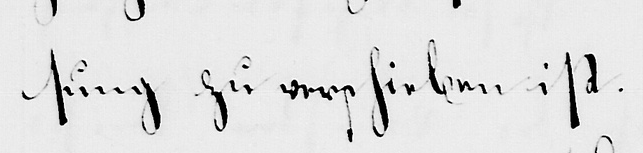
sung zu verschieben ist.
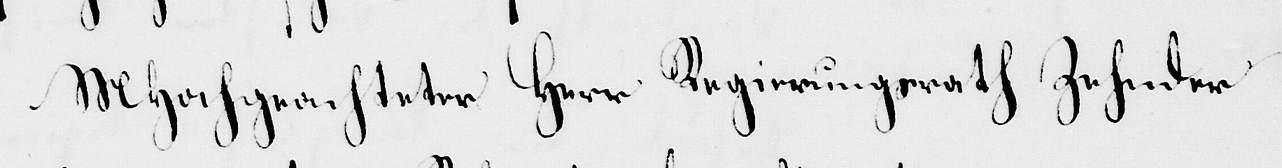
MHochgeachteter Herr Regierungsrath Zehnder
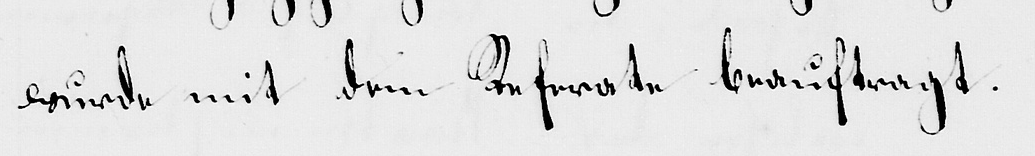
wurde mit dem Referate beauftragt.
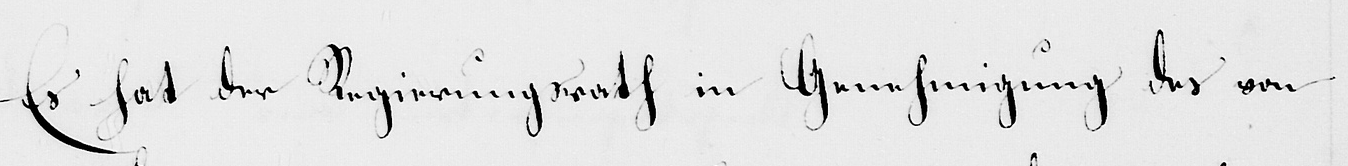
Es hat der Regierungsrath in Genehmigung des von
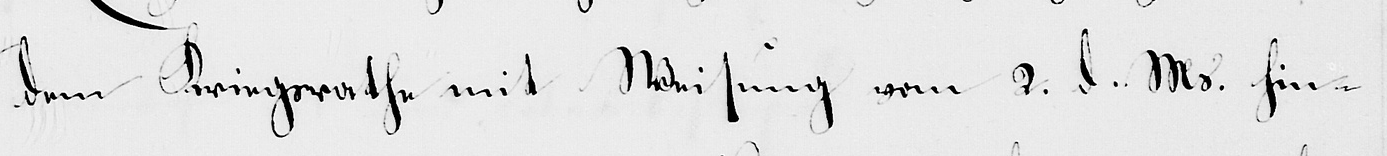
dem Kriegsrathe mit Weisung vom 2. d. Ms. hin¬
